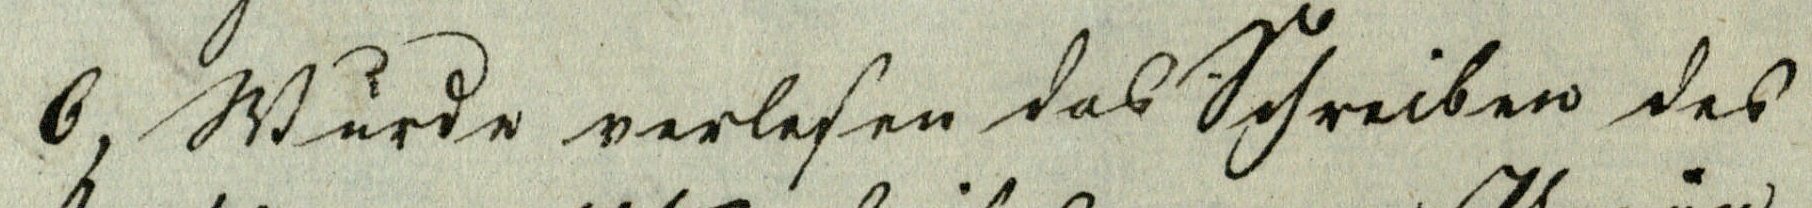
6, Wurde verlesen das Schreiben des
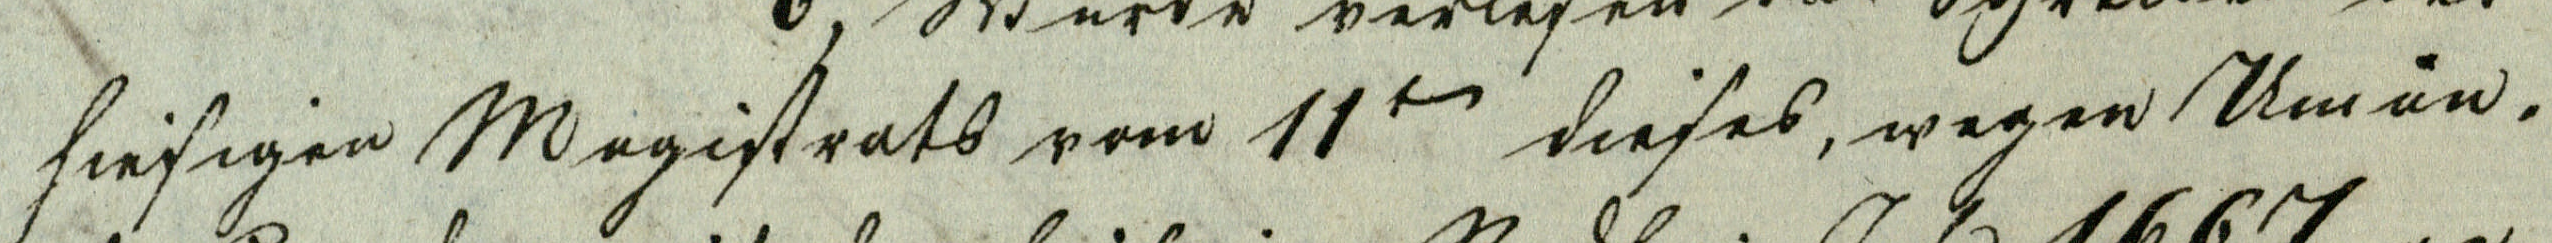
hiesigen Magistrats vom 11ten dieses, wegen Umän¬
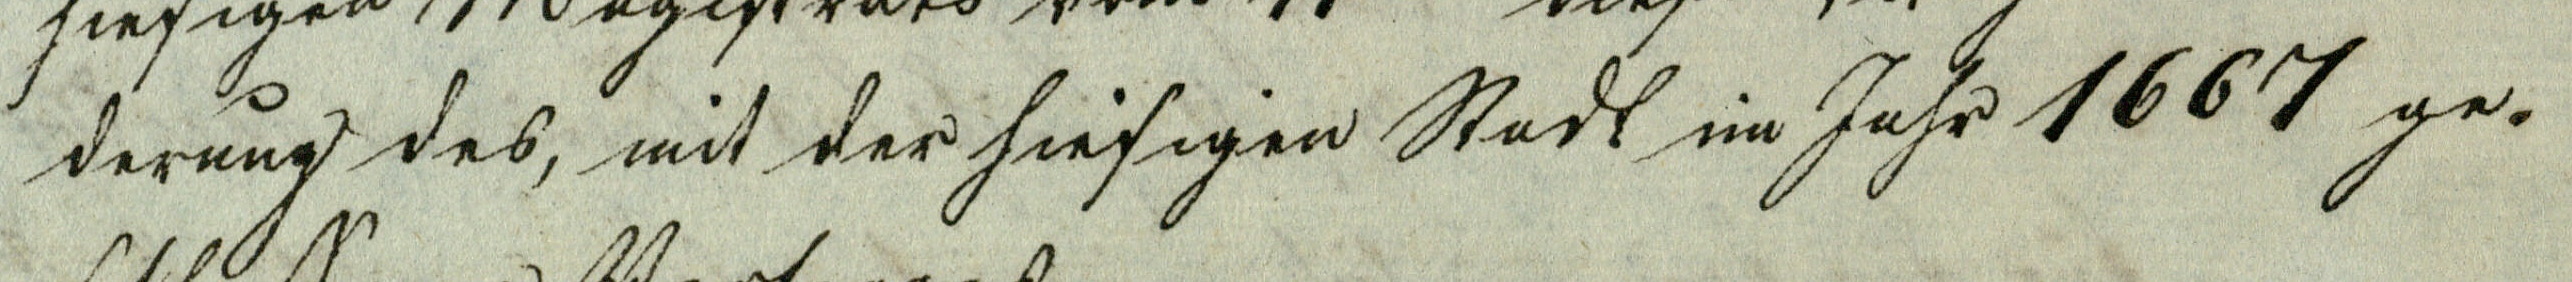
derung des, mit der hiesigen Stadt im Jahr 1667
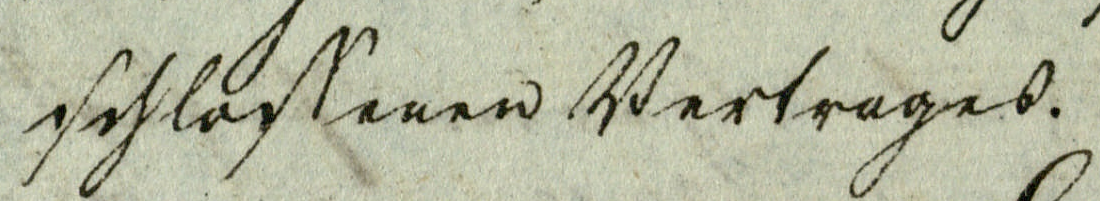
geschlossenen Vertrages.
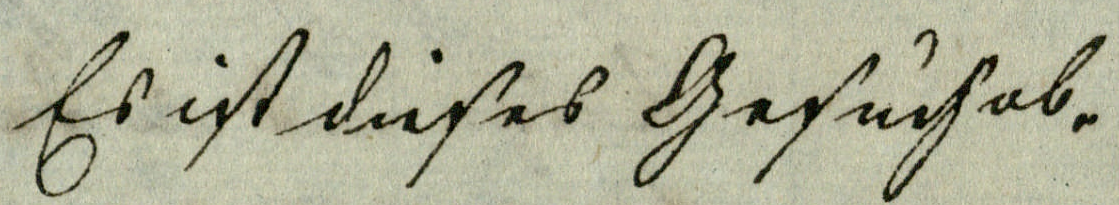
Es ist dieses Gesuch ab¬
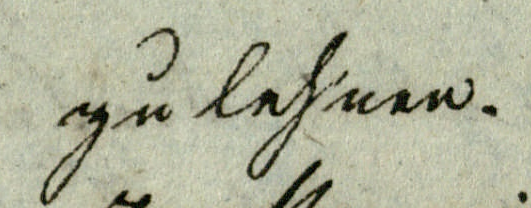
zu lehnen.
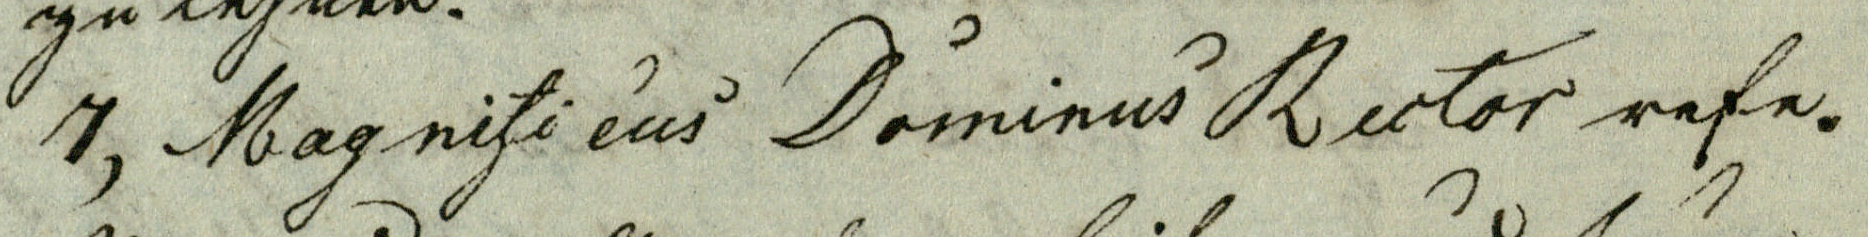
7, Magnificus Dominus Rector refe¬
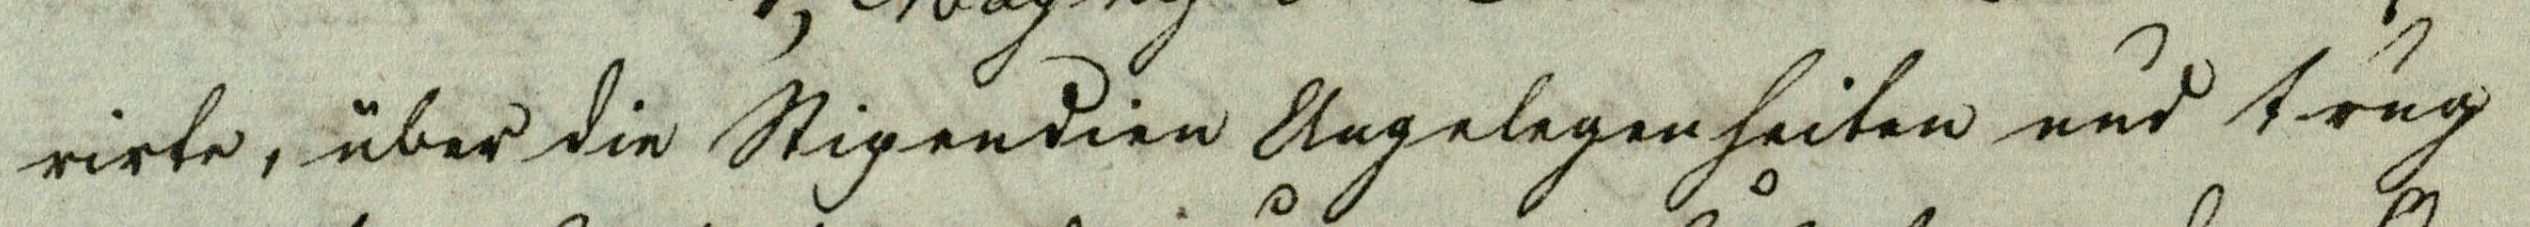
rirte, über die Stipendien Angelegenheiten und trug
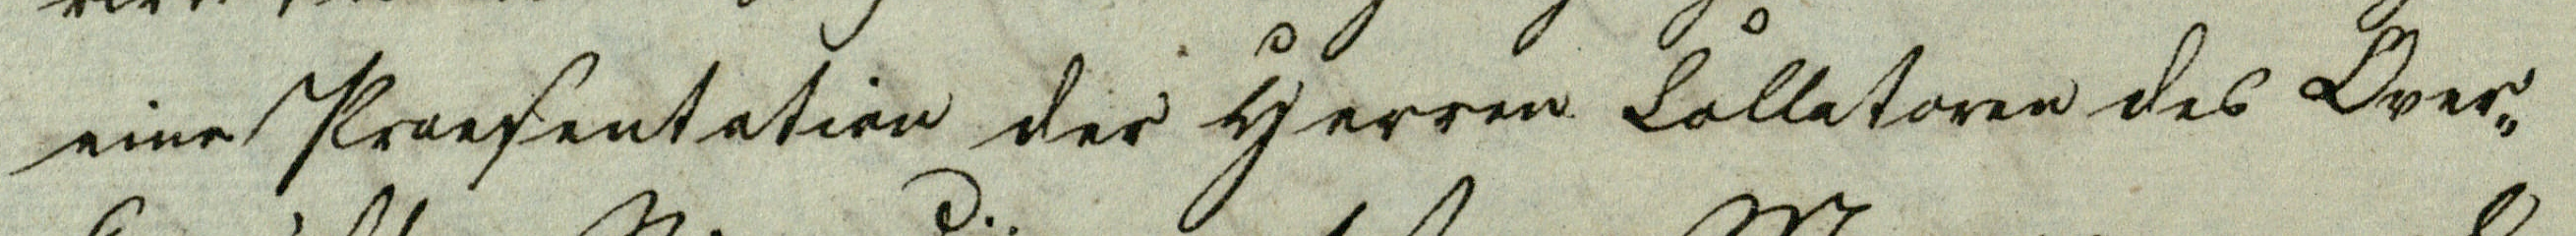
eine Praesentation der Herren Collatoren des Over¬
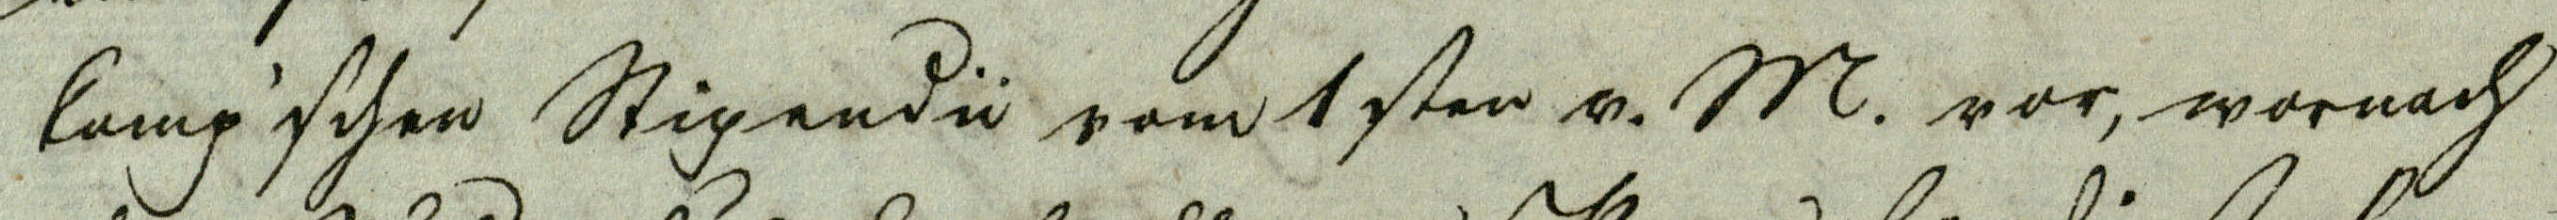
kamp'schen Stipendii vom 1ten v. M. vor, wornach
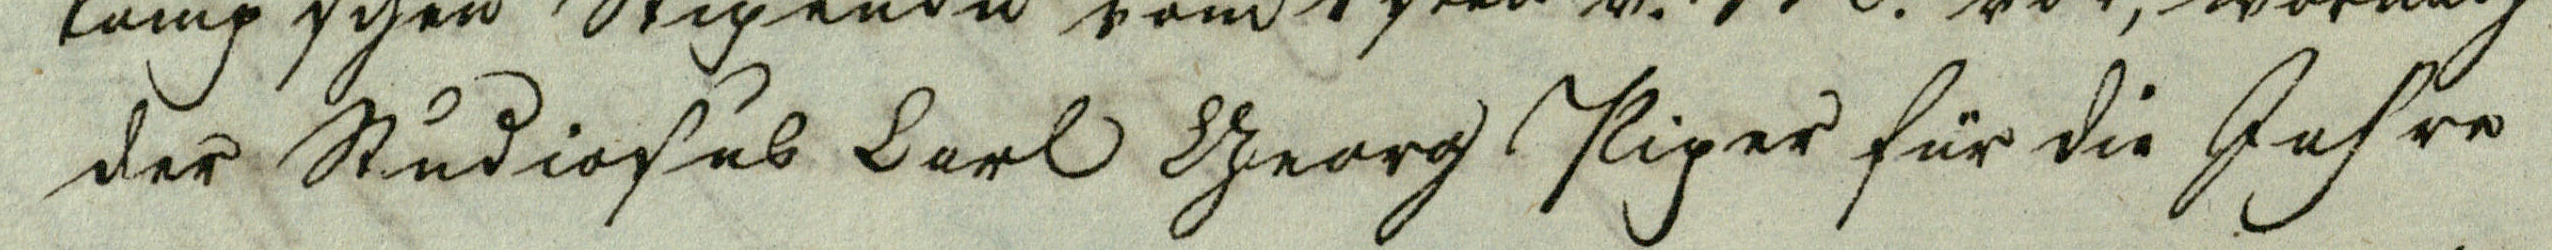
der Studiosus Carl Georg Piper für die Jahre
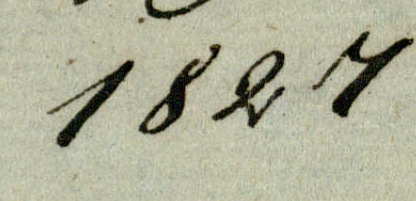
1827
